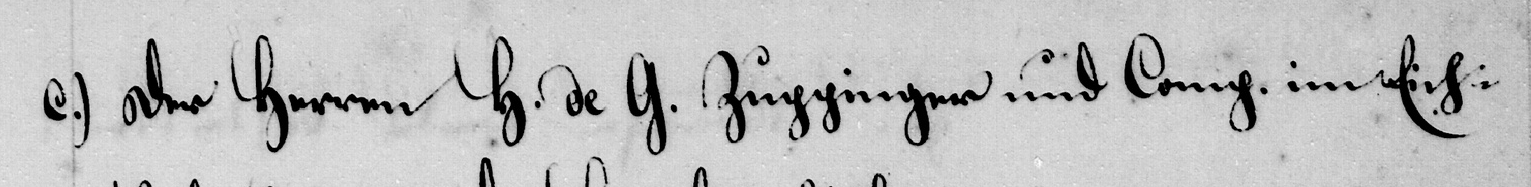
c.) der Herren H. de G. Zuppinger und Comp. im Eich¬
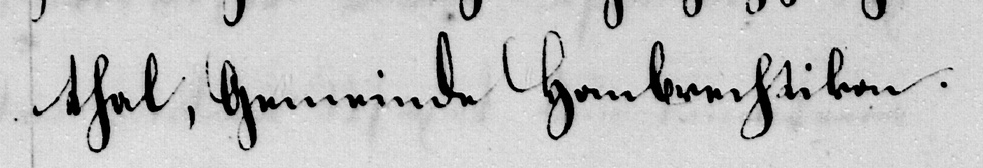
thal, Gemeinde Hombrechtikon.
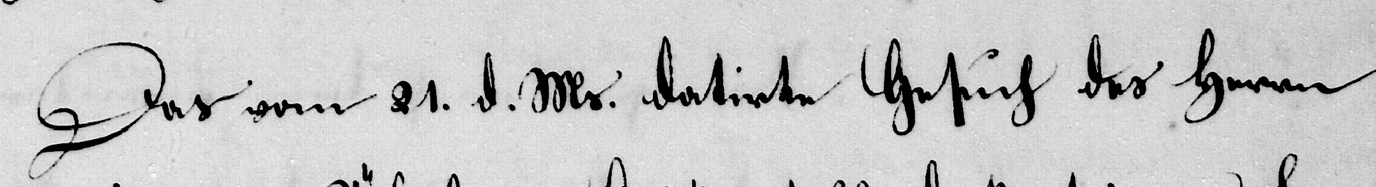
Das vom 21. d. Ms. datirte Gesuch des Herrn
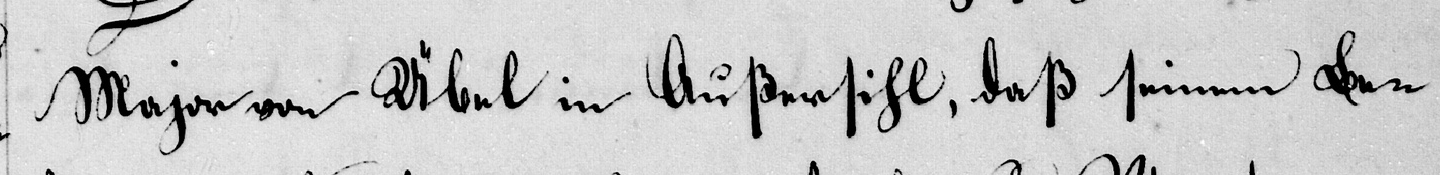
Major von Übel in Außersihl, daß seinem be¬
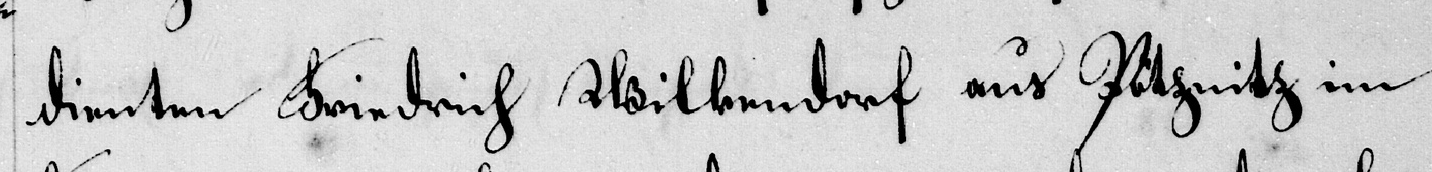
dienten Friedrich Wilkendorf aus Pütznitz im
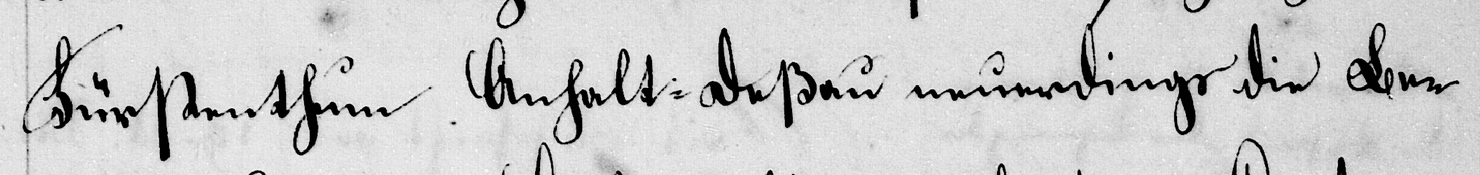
Fürstenthum Anhalt-Deßau neuerdings die Be¬
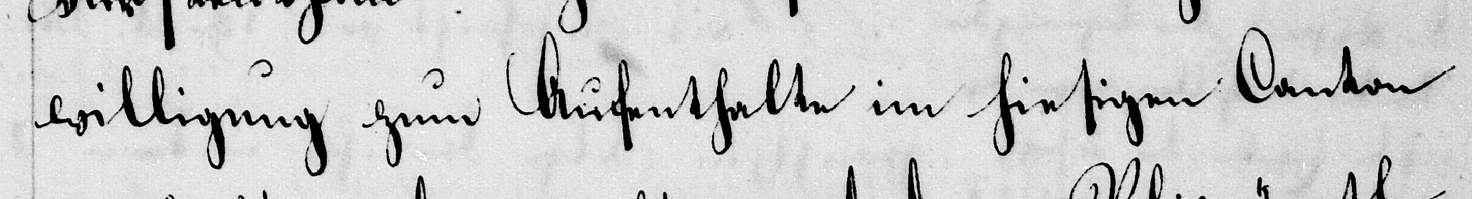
willigung zum Aufenthalte im hiesigen Canton
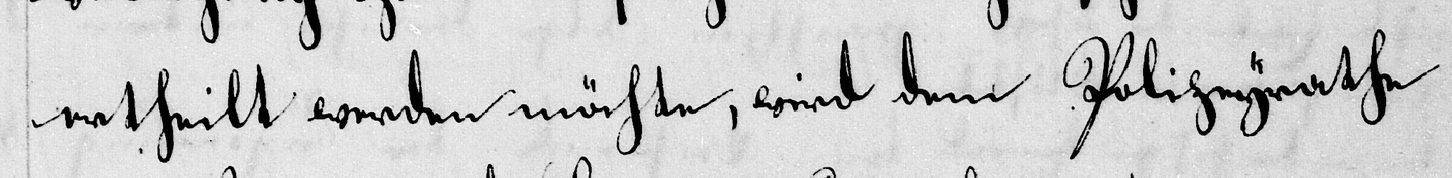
ertheilt werden möchte, wird dem Polizeyrathe
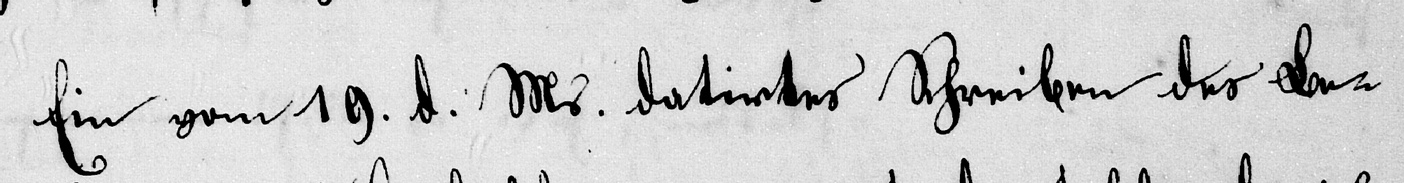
Ein vom 19. d. Ms. datirtes Schreiben des Be¬
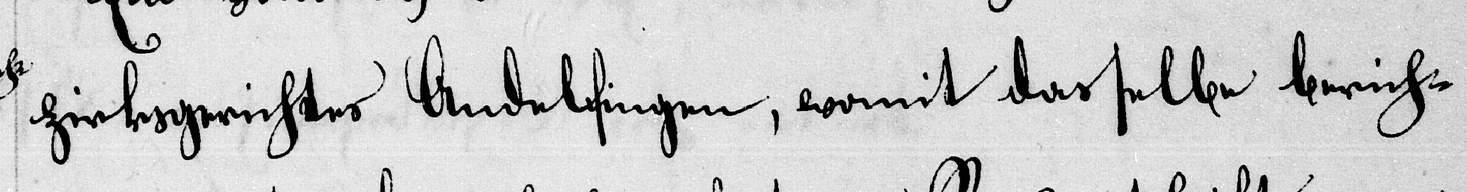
zirksgerichtes Andelfingen, womit dasselbe berich¬
